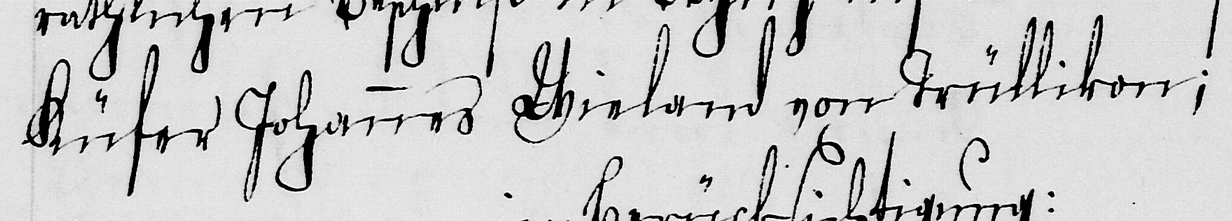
Küfer Johannes Wieland von Trüllikon;
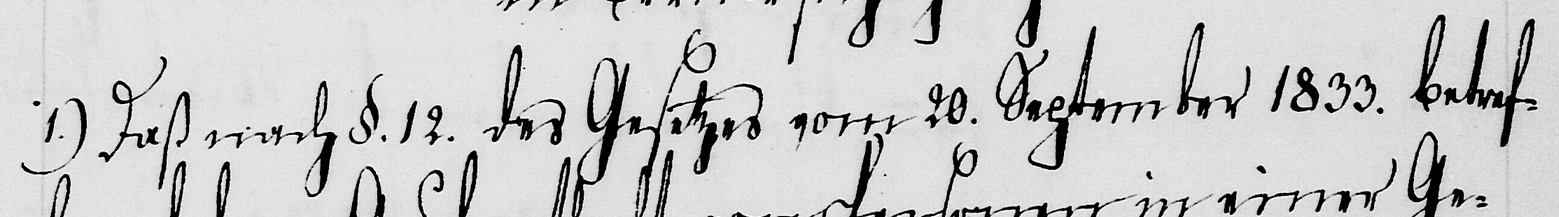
1.) Daß nach §. 12. des Gesetzes vom 20. September 1833. betref¬
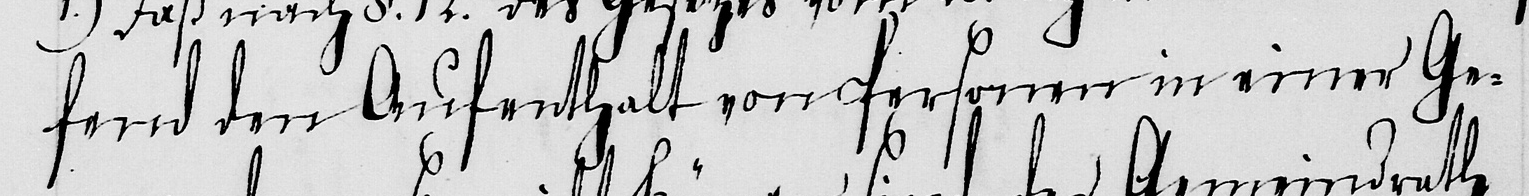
fend den Aufenthalt von Personen in einer Ge¬
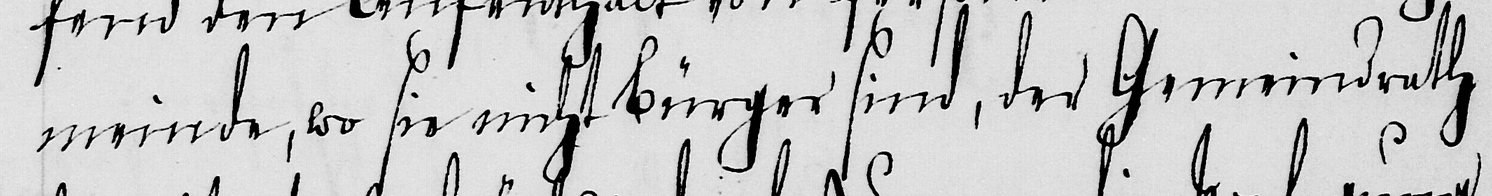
meinde, wo sie nicht Bürger sind, der Gemeindrath
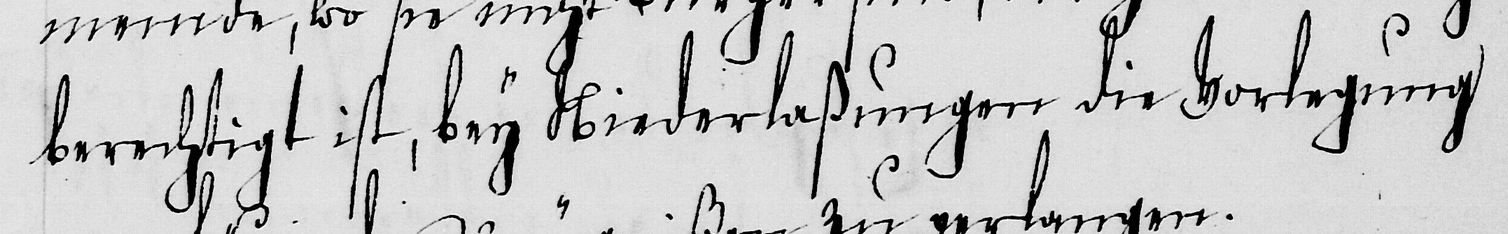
berechtigt ist, bey Niederlaßungen die Vorlegung
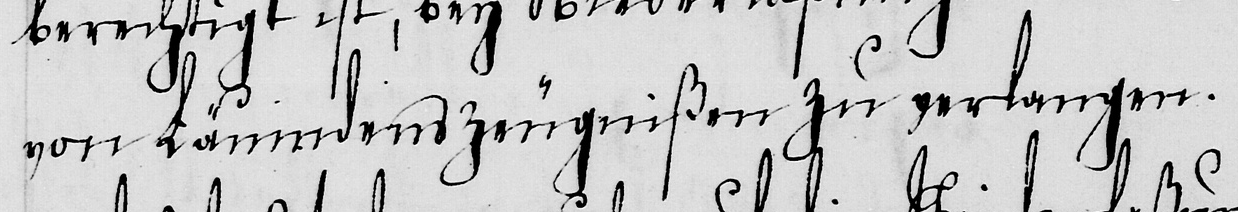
von Läumdenszeugnißen zu verlangen.
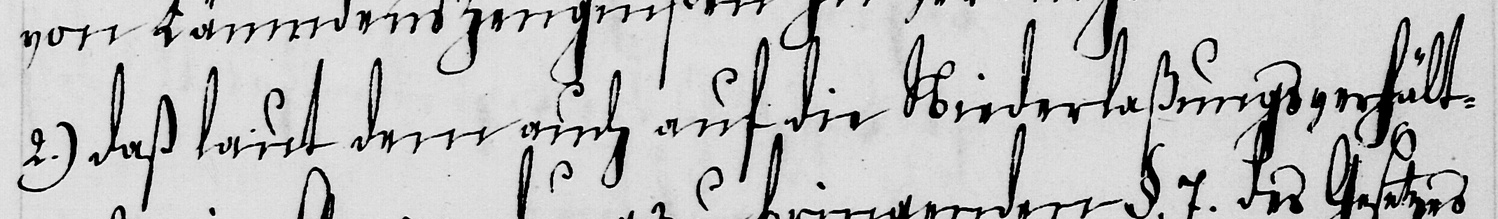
2.) Daß laut dem auch auf die Niederlaßungsverhält¬
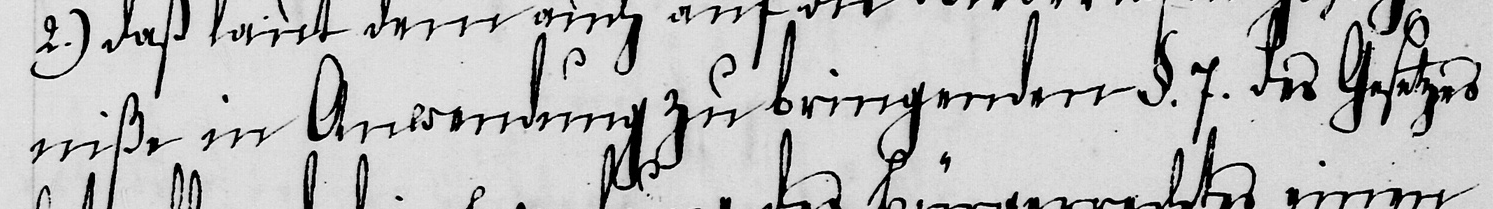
niße in Anwendung zu bringenden §. 7. des Gesetzes
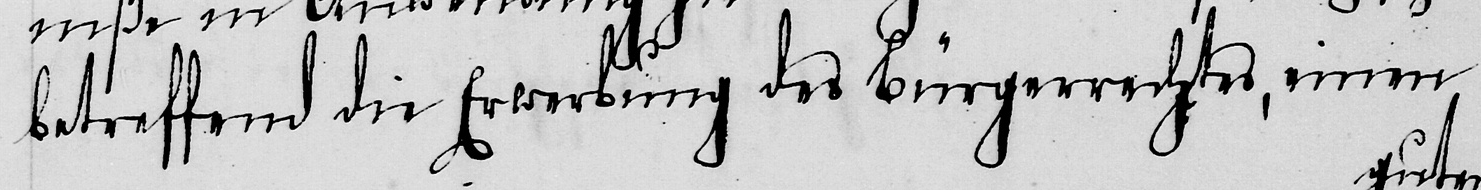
betreffend die Erwerbung des Bürgerrechtes, einen
